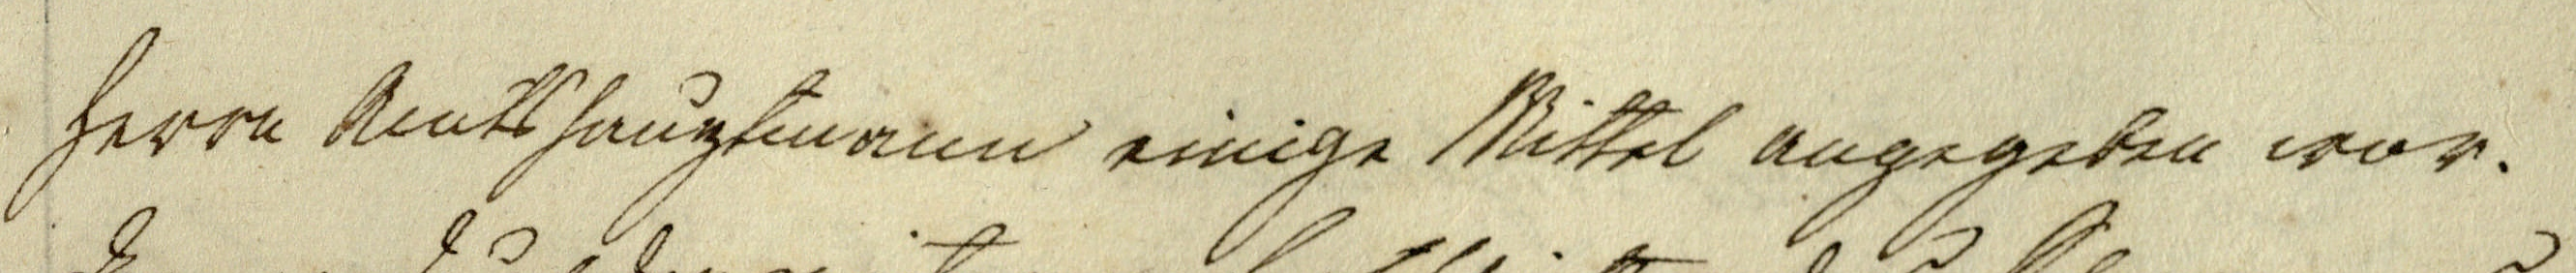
Herrn Amtshauptmann einige Mittel angegeben wor¬
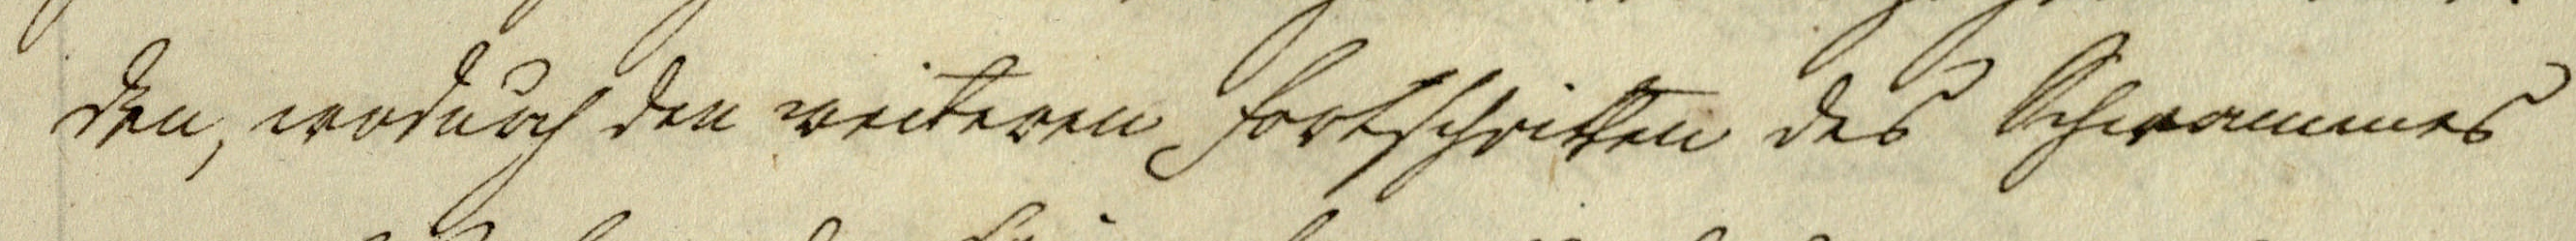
den, wodurch den weiteren Fortschritten des Schwammes
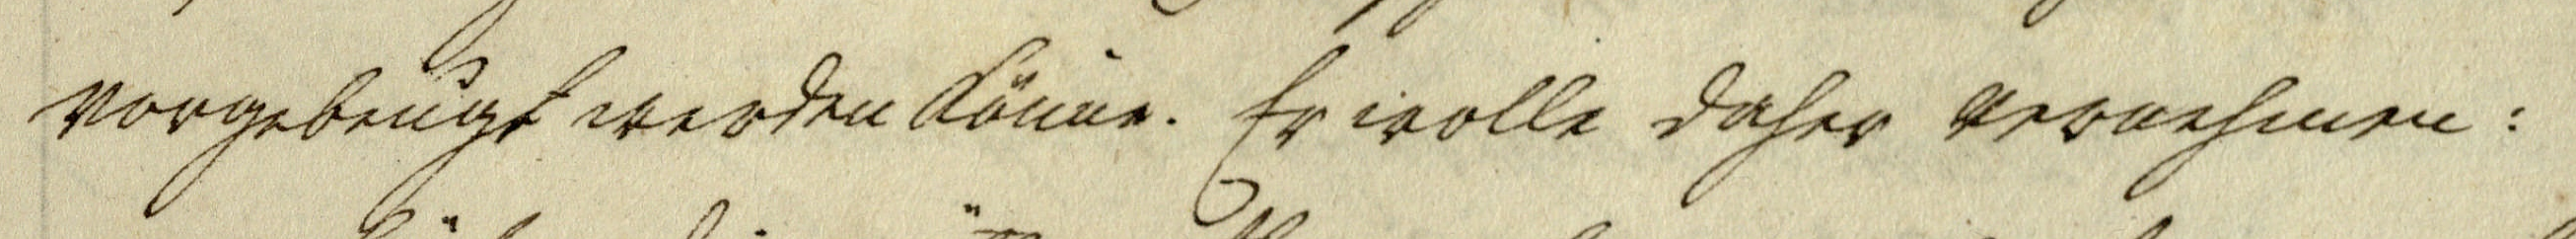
vorgebeugt werden könne. Er wolle daher vernehmen:
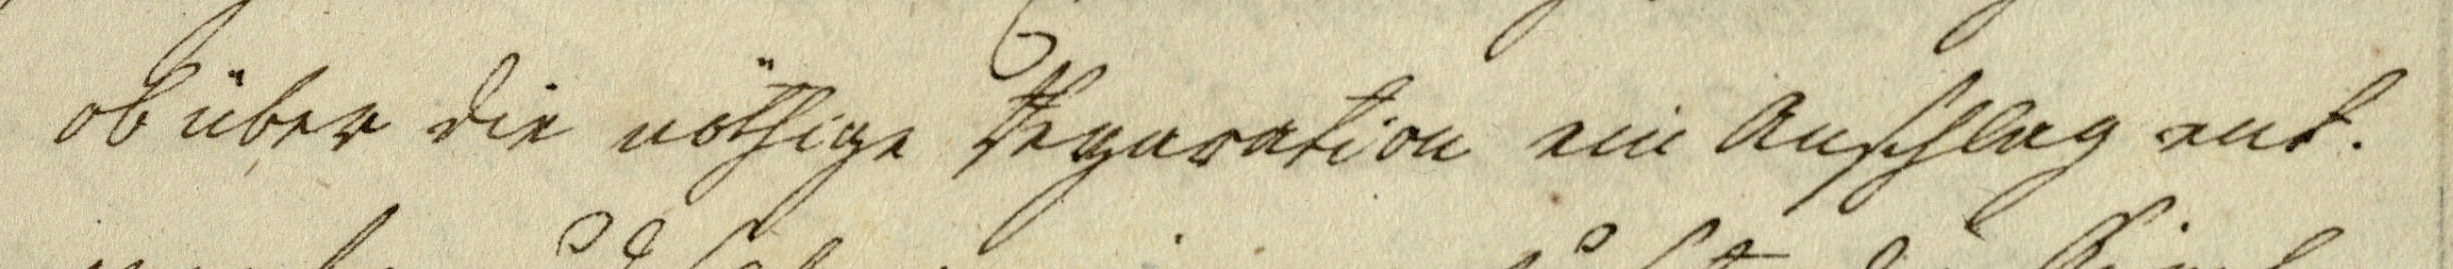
ob über die nöthige Reparation ein Anschlag ent¬
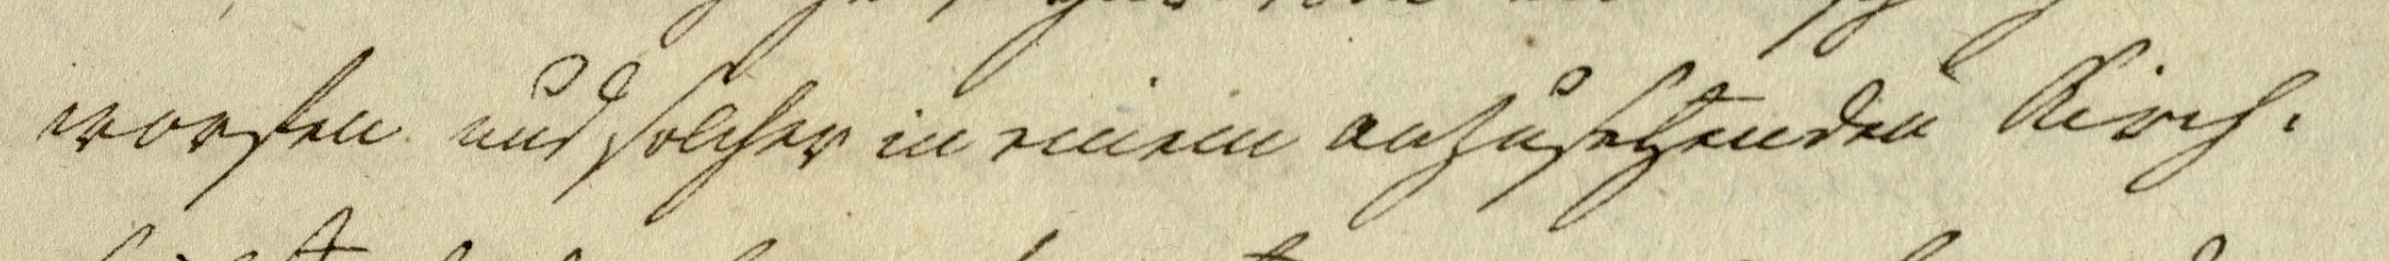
worfen und solcher in einem anzusetzenden Kirch¬
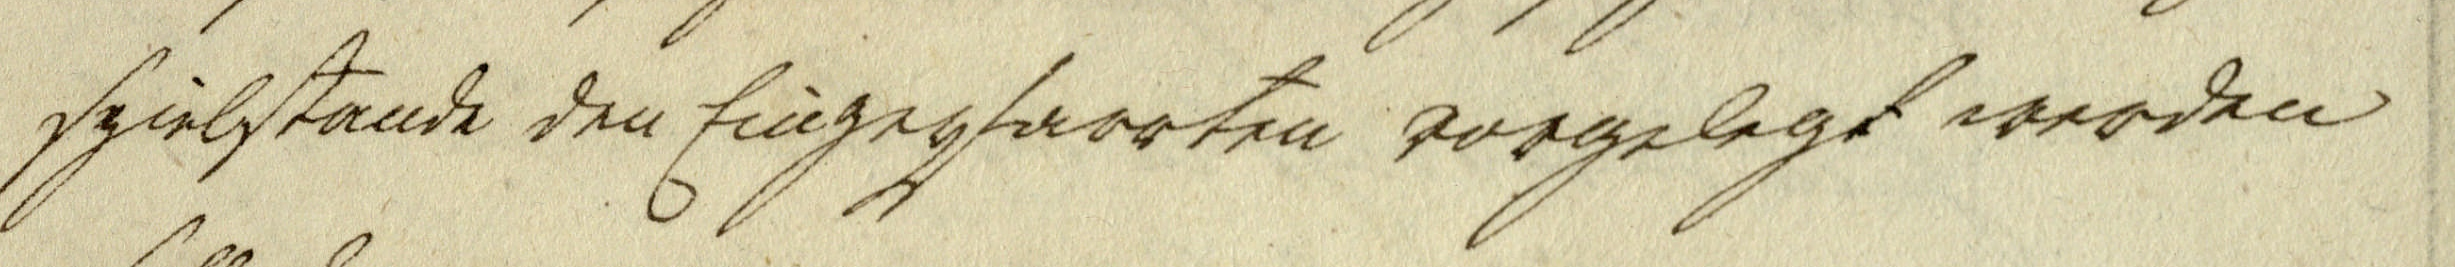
spielstande den Eingepfarrten vorgelegt werden
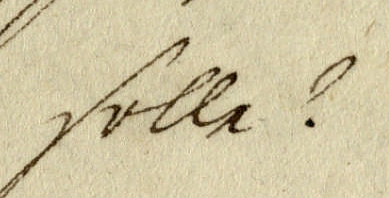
solle?
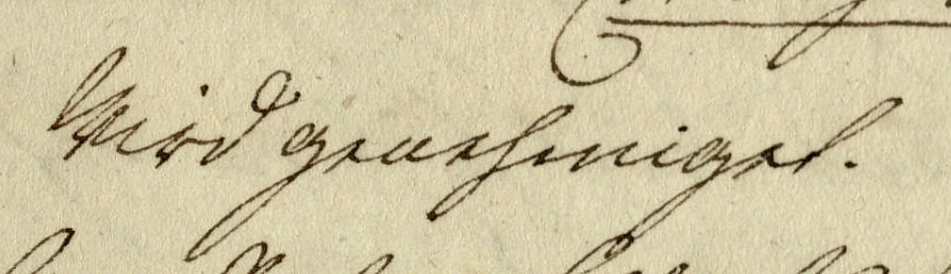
Wird genehmiget.
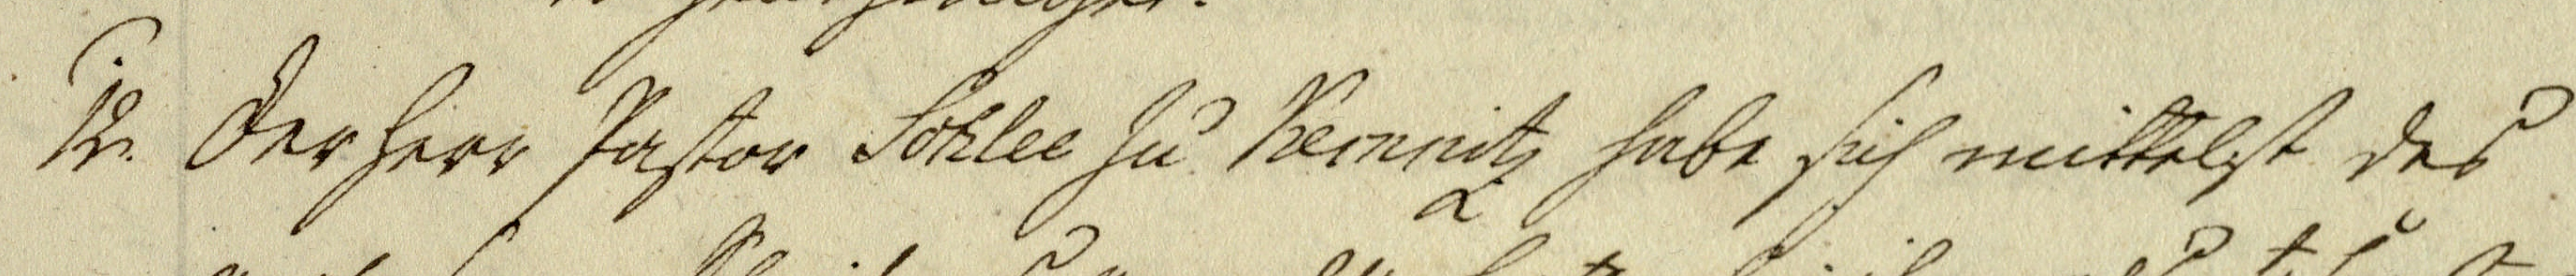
12. Der Herr Pastor Schlee zu Kemnitz habe sich mittelst des
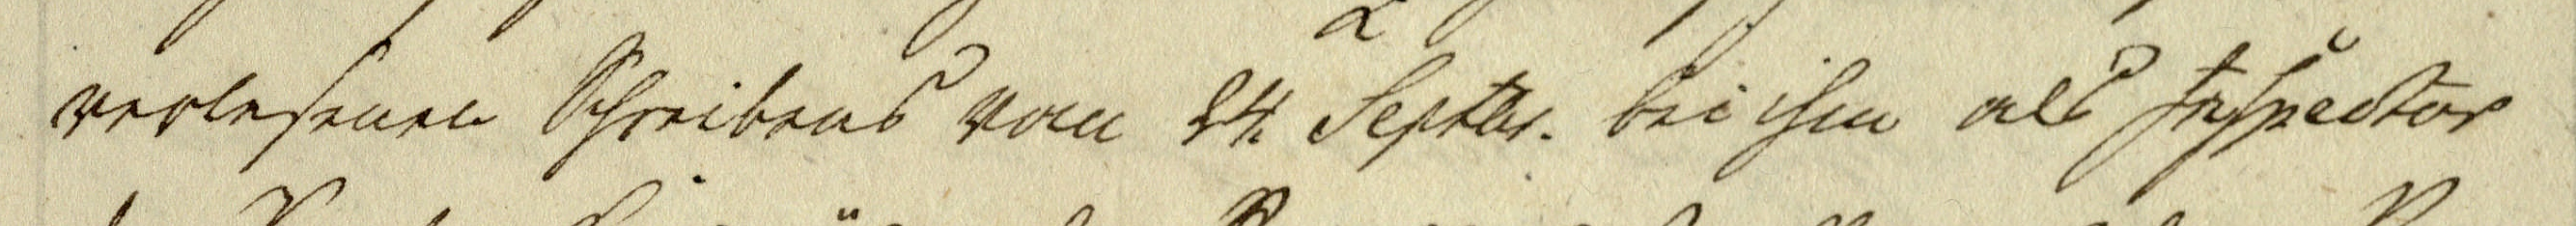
verlesenen Schreibens vom 24. Septbr. bei ihm als Inspector
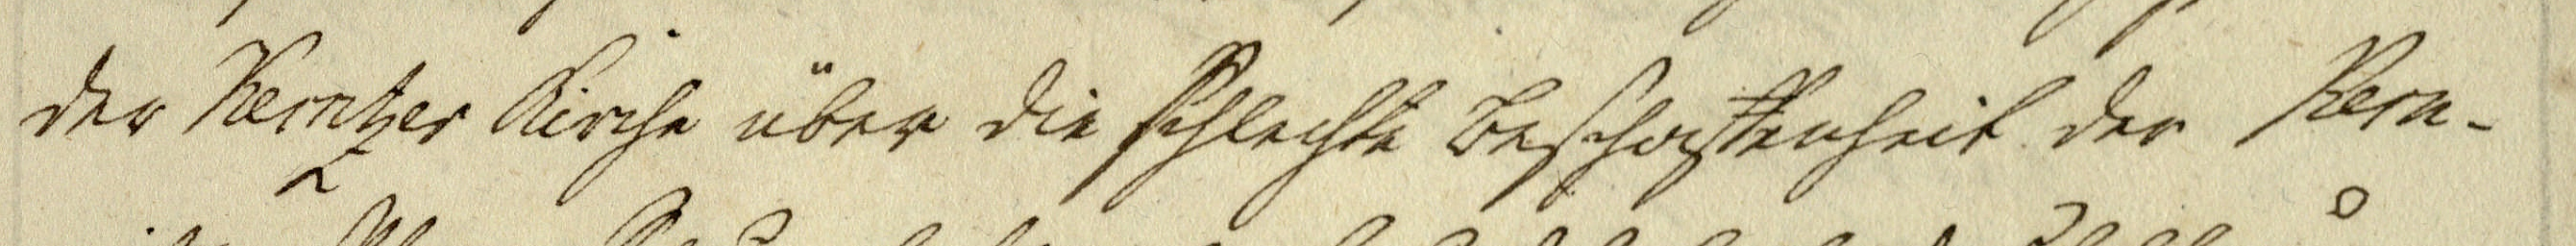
der Kemtzer Kirche über die schlechte Beschaffenheit der Kem¬
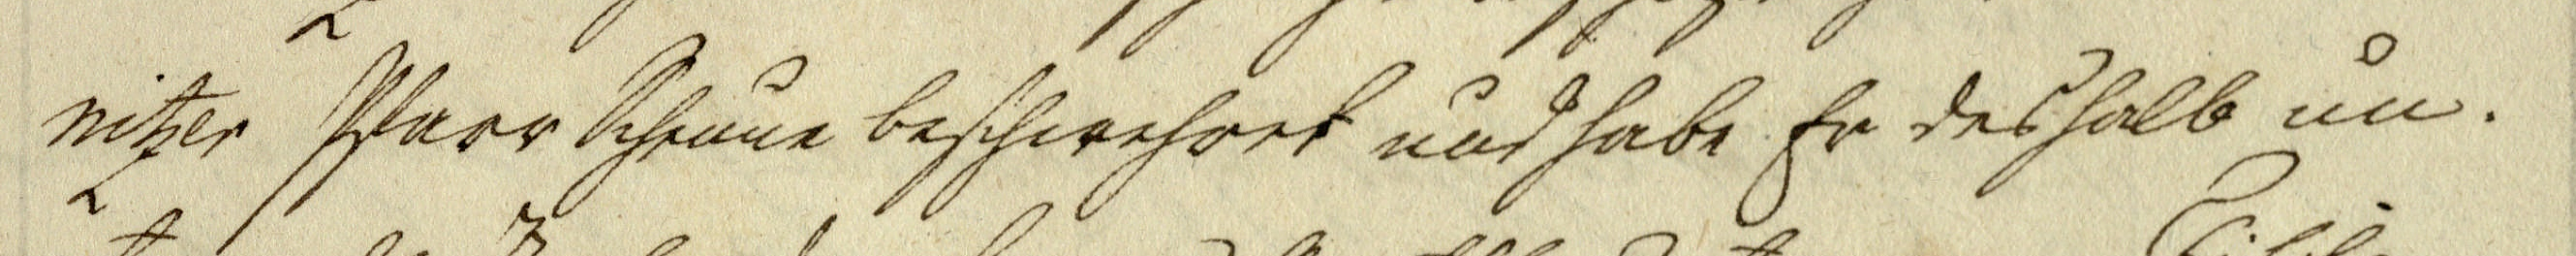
nitzer Pfarr Schule beschwehret und habe Er deshalb un¬
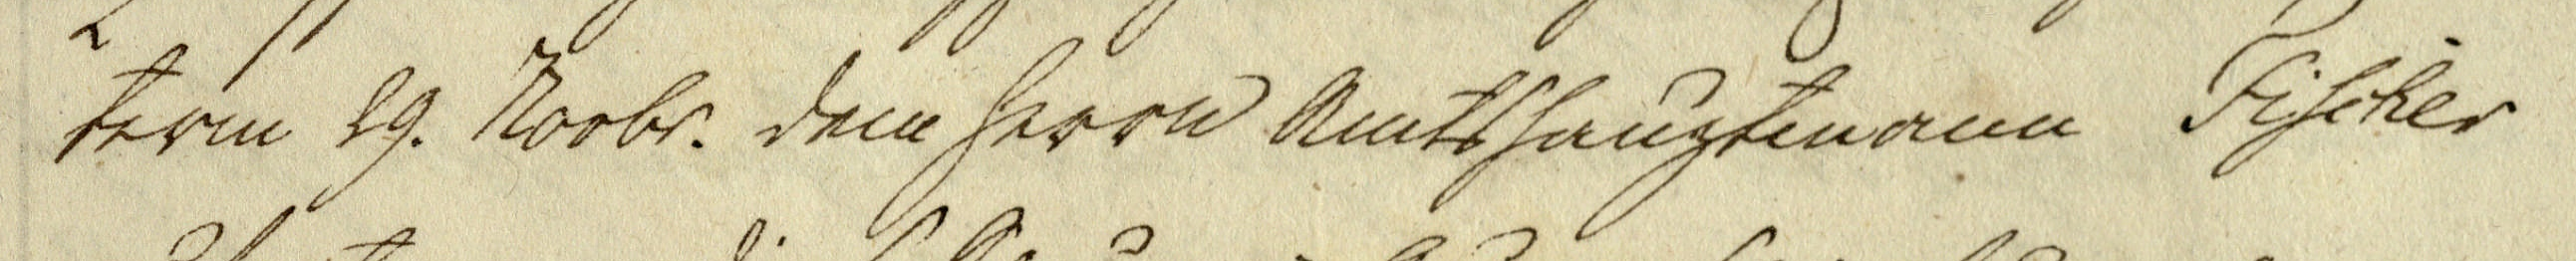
term 29. Novbr. dem Herrn Amtshauptmann Fischer
